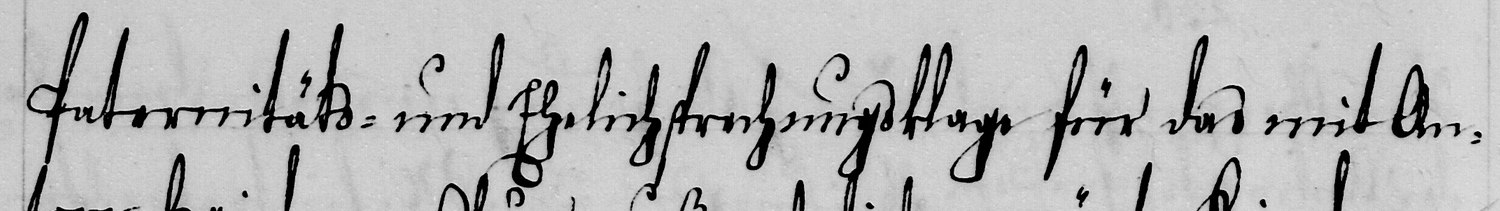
Paternitäts- und Ehelichsprechungsklage für das mit An¬
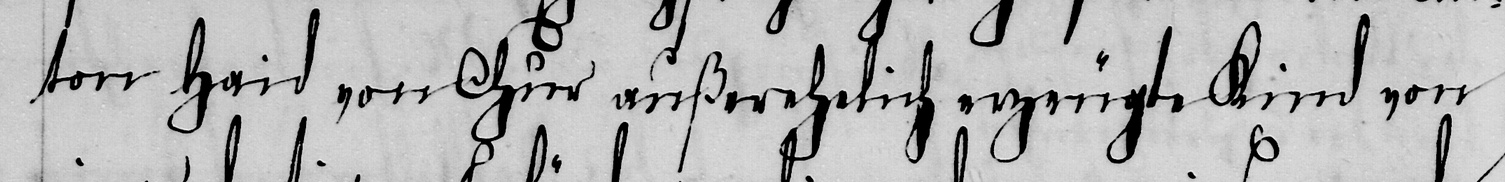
ton Haid von Chur außerehelich erzeugte Kind von
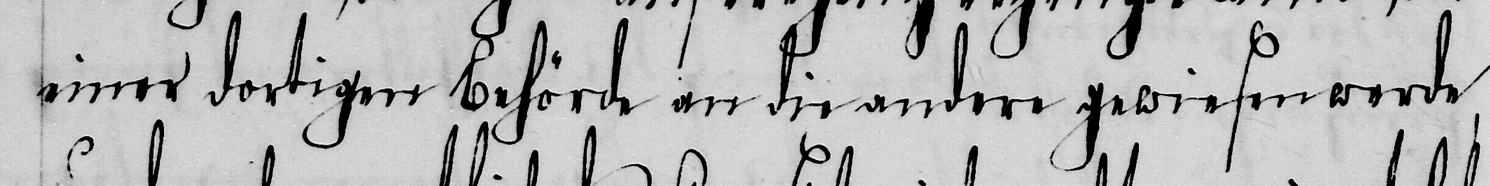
einer dortigen Behörde an die andere gewiesen werde
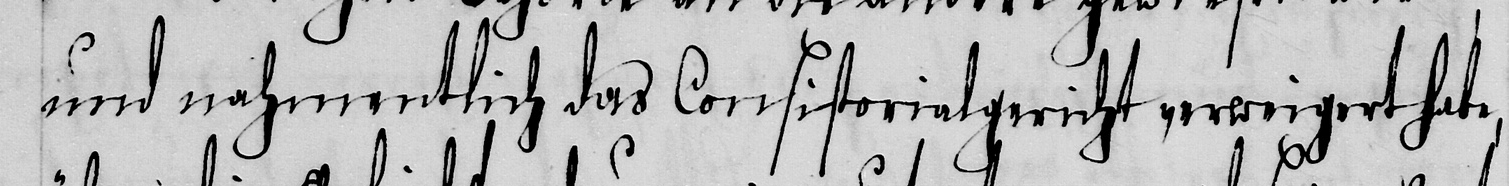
und nahmentlich das Consistorialgericht verweigert hab¬
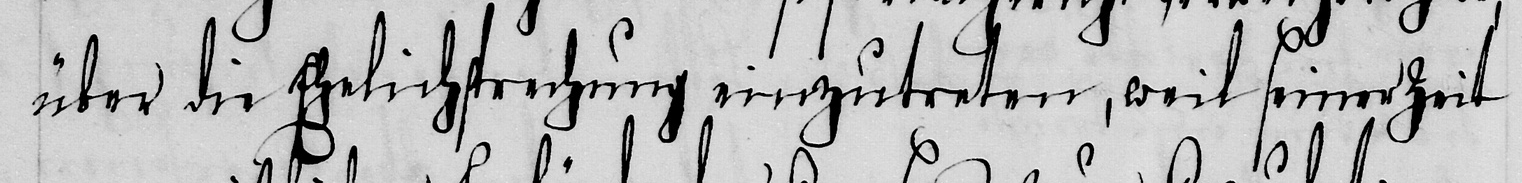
über die Ehelichsprechung einzutreten, weil seiner Zeit
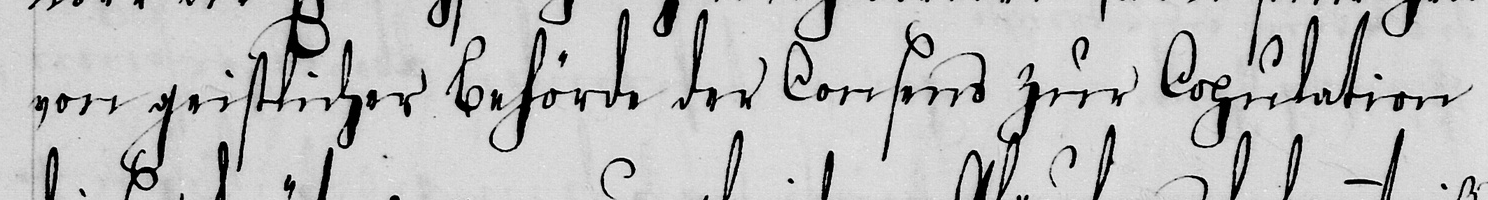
von geistlicher Behörde der Consens zur Copulation
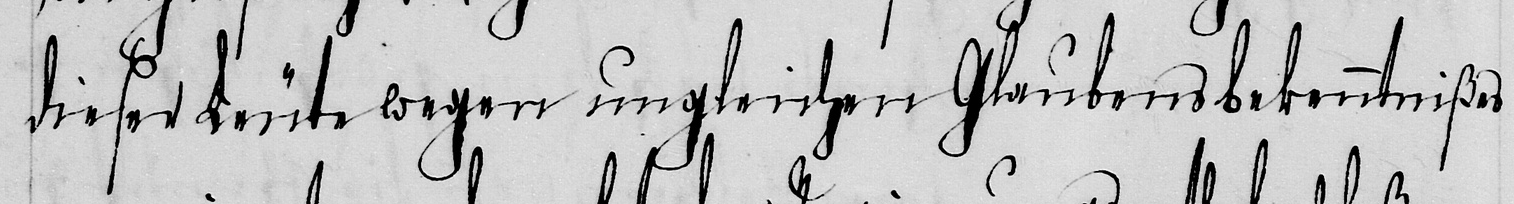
dieser Leute wegen ungleichen Glaubensbekenntnißes
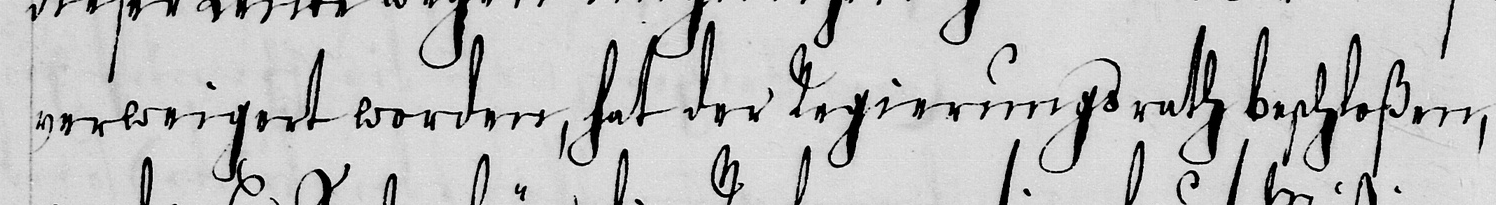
verweigert worden, hat der Regierungsrath beschloßen,
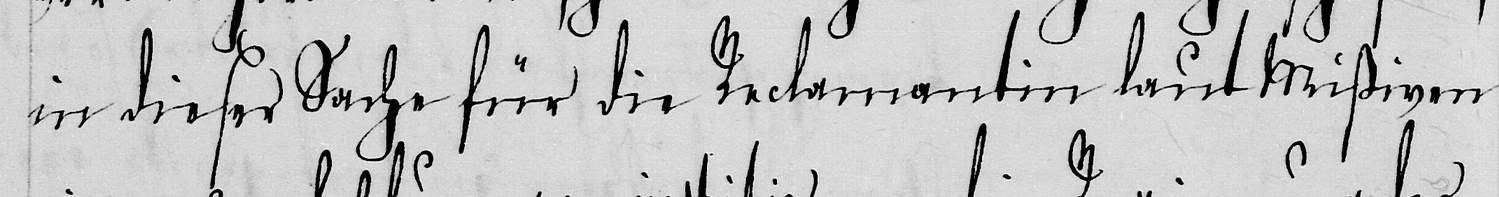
in dieser Sache für die Reclamation laut Mißiven
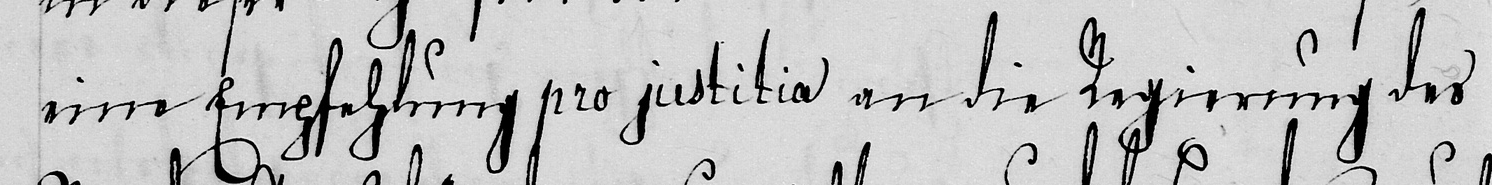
eine Empfehlung pro justitia an die Regierung des
